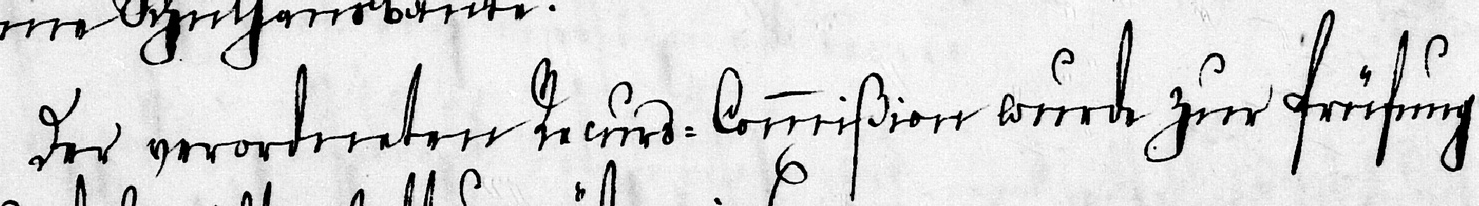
Der verordneten Recurs-Commißion wurde zur Prüfung
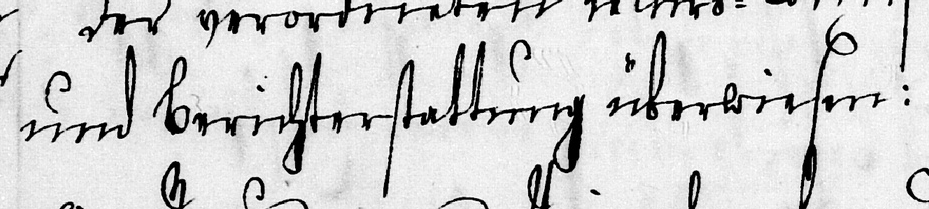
und Berichterstattung überwiesen:
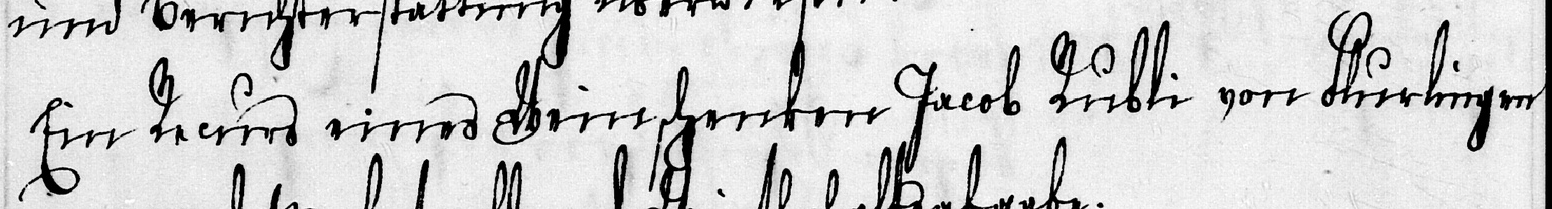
Ein Recurs eines Weinschenken Jacob Rubli von Flurlingen
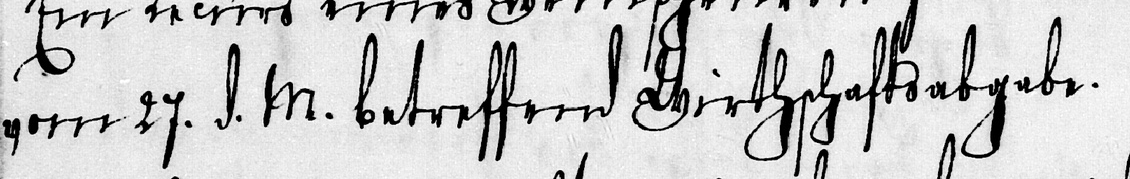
vom 27. d. M. betreffend Wirthschaftsabgabe.
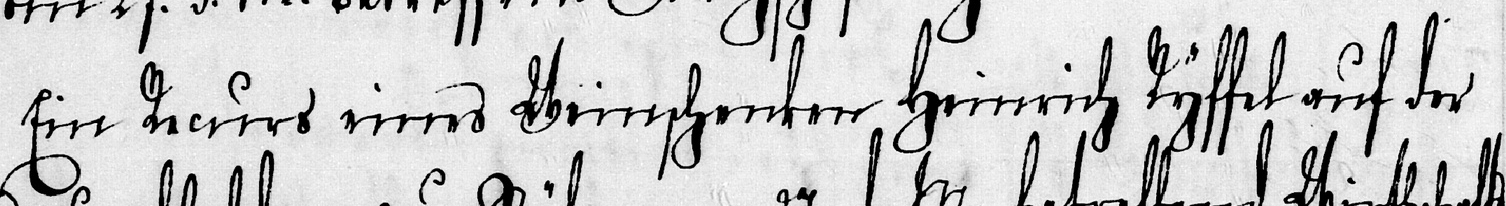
Ein Recurs eines Weinschenken Heinrich Ryffel auf der
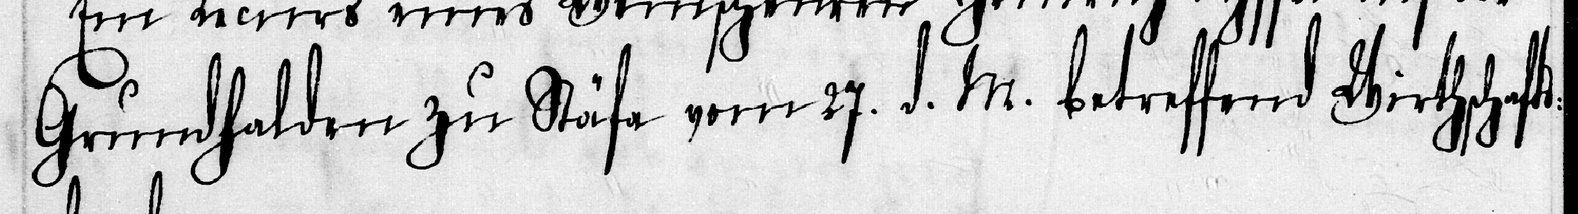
Grundhalden zu Stäfa vom 27. d. M. betreffend Wirthschaft¬
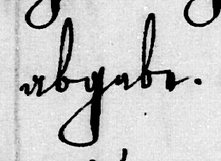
sabgabe.
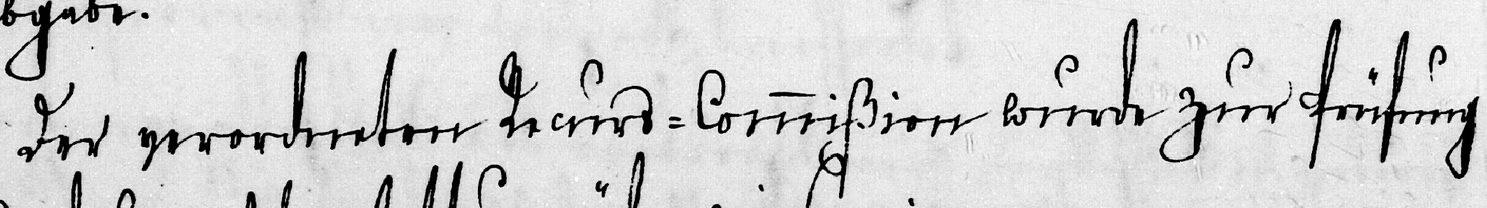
Der verordneten Recurs-Commißion wurde zur Prüfung
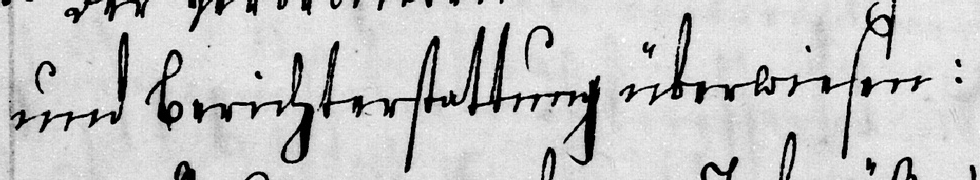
und Berichterstattung überwiesen:
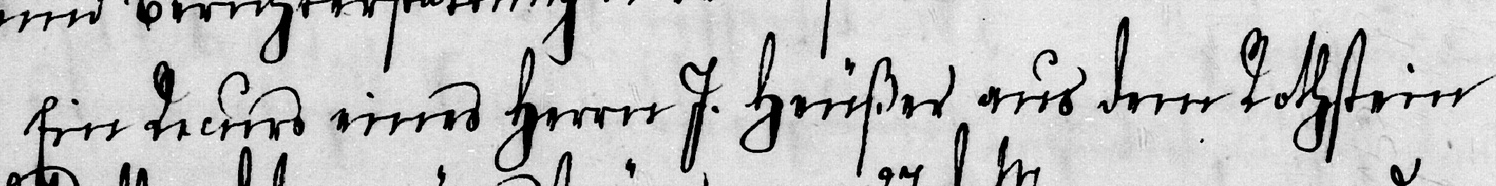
Ein Recurs eines Herrn J. Heußer aus dem Rothstein
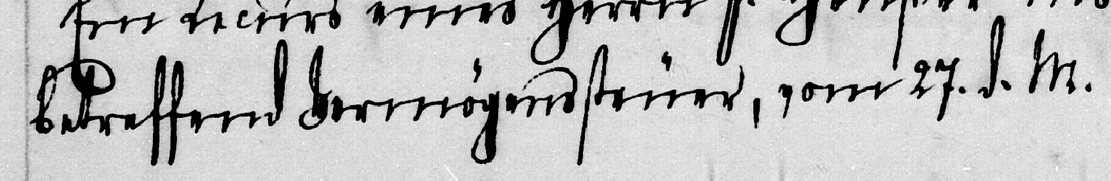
betreffend Vermögenssteuer, vom 27. d. M.
